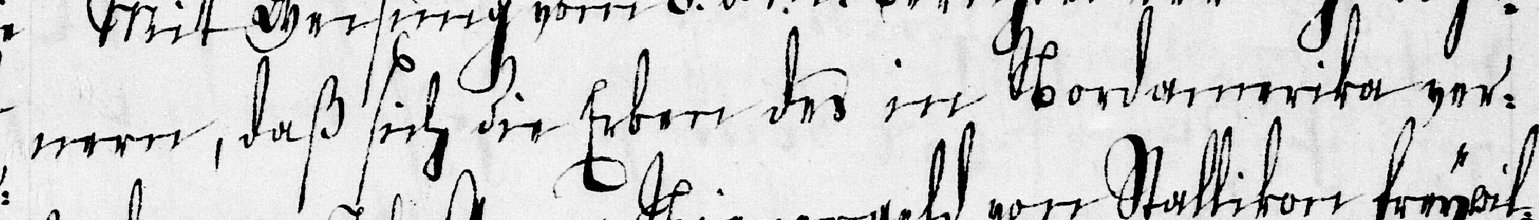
nern, daß sich die Erben des in Nordamerika vers¬
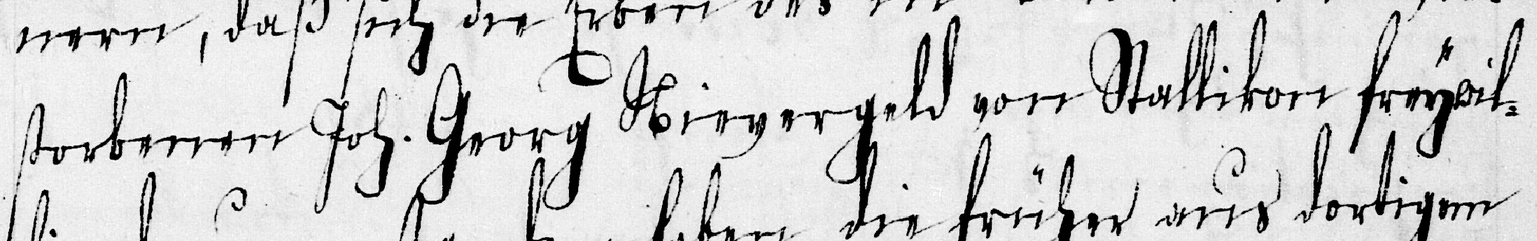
torbenen Joh. Georg Nievergeld von Stallikon freywi¬
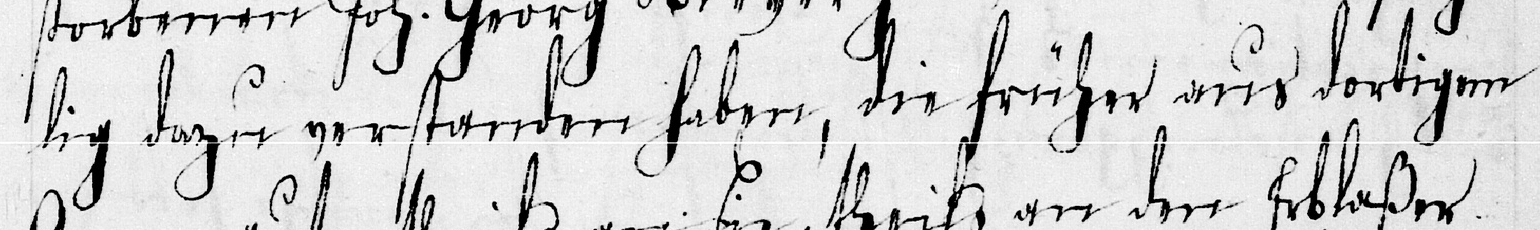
llig dazu verstanden haben, die früher aus dortigem
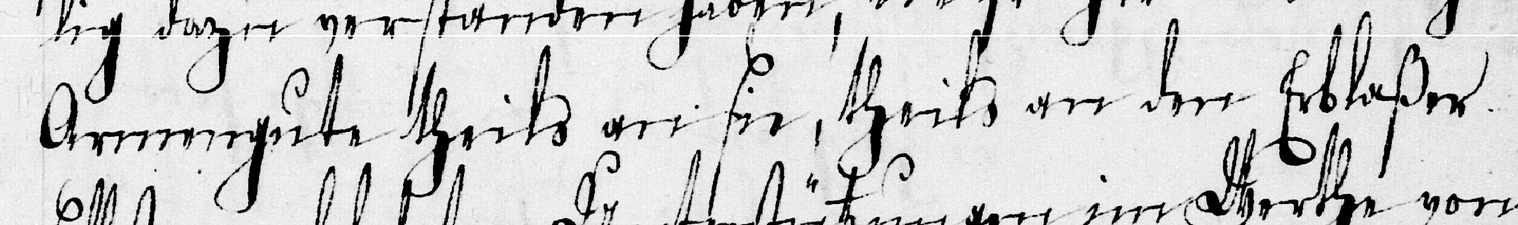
Armengute theils an sie, theils an den Erblaßer
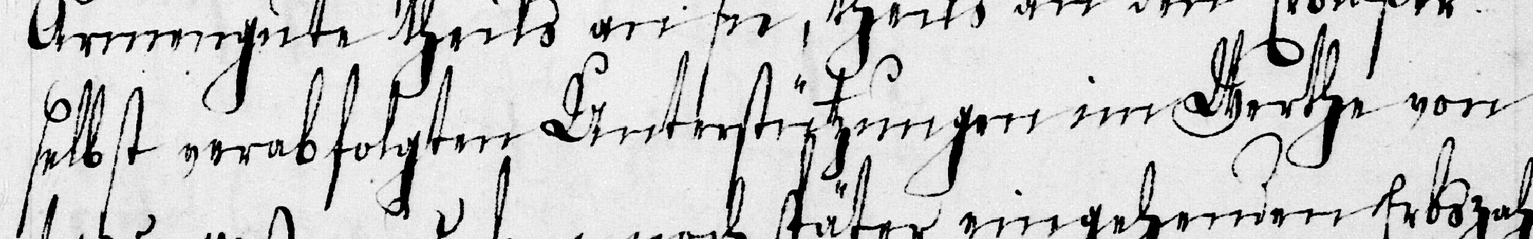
selbst verabfolgten Unterstützungen im Werthe von
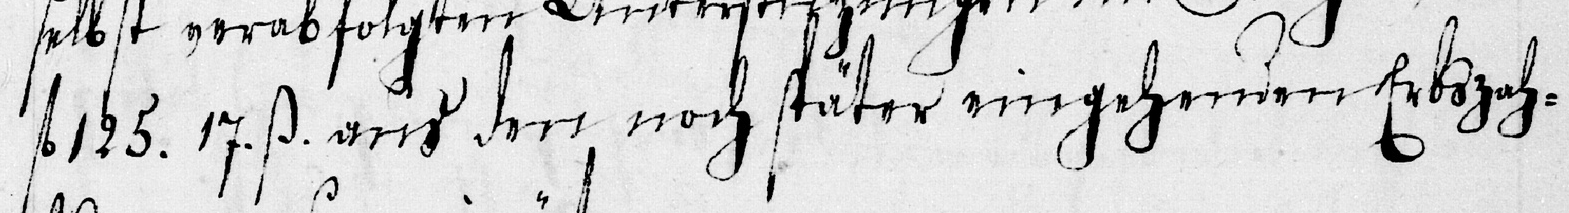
fl. 125. 17. ß. aus den noch später eingehenden Erbszah¬
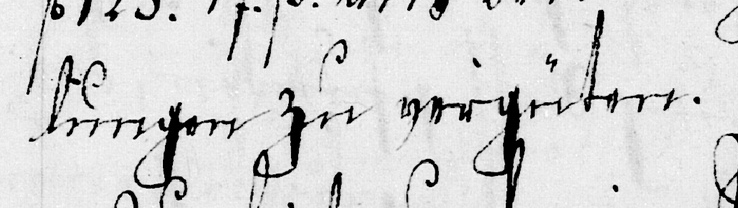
lungen zu vergüten.
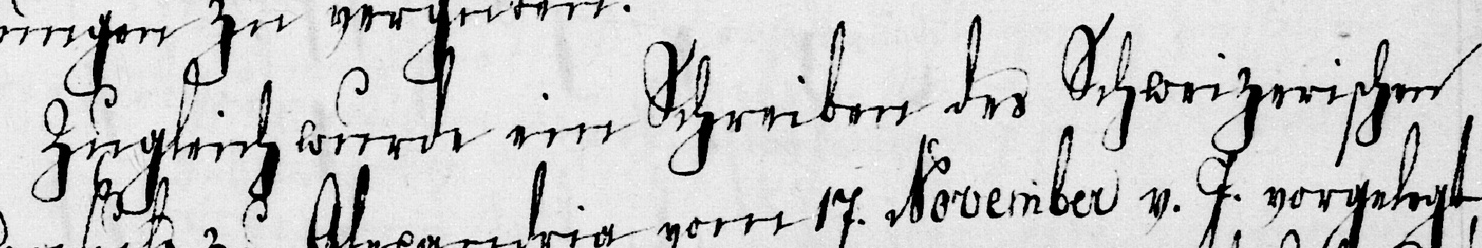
Zugleich wurde ein Schreiben des Schweizerischen
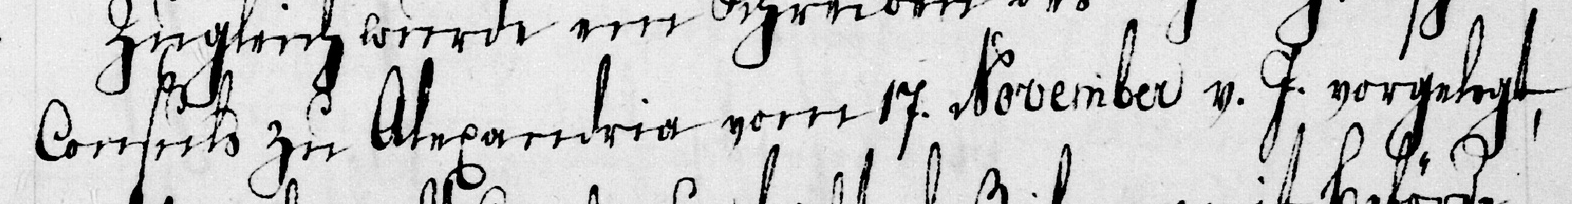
Consuls zu Alexandria vom 17. November v. J. vorgelegt,
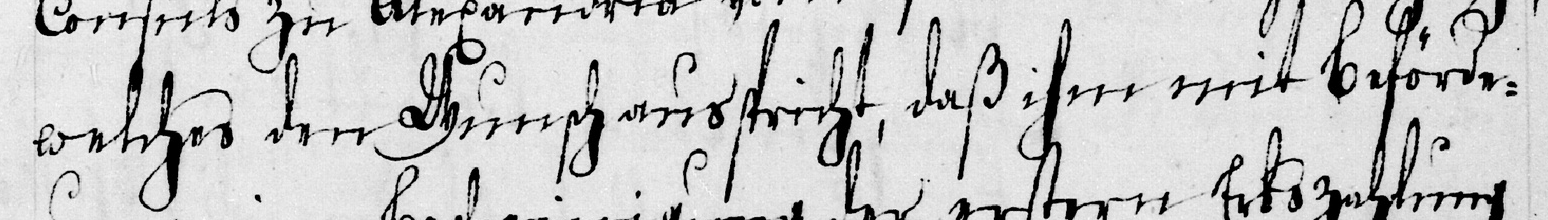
welches den Wunsch ausspricht, daß ihm mit Beförde¬
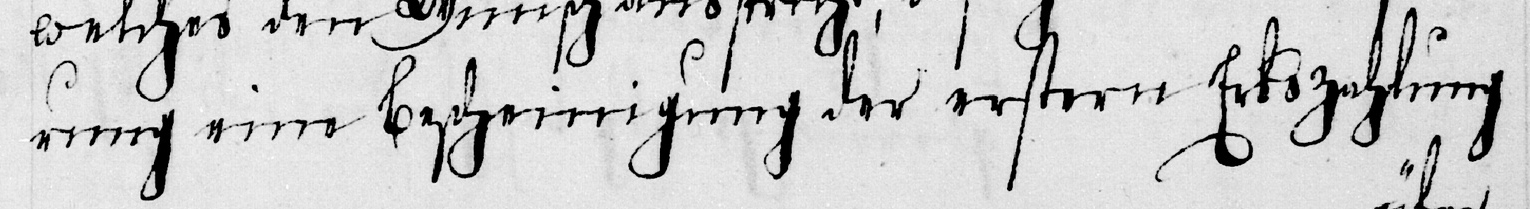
rung eine Bescheinigung der ersten Erbszahlung
